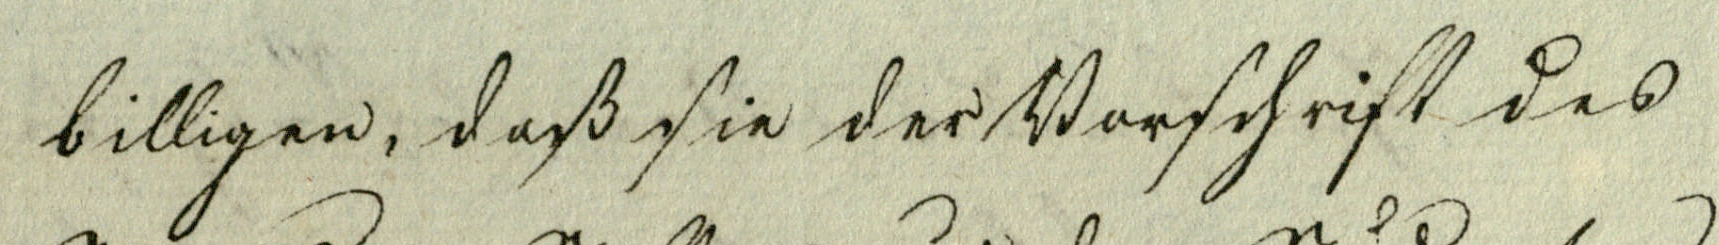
billigen, daß sie der Vorschrift des
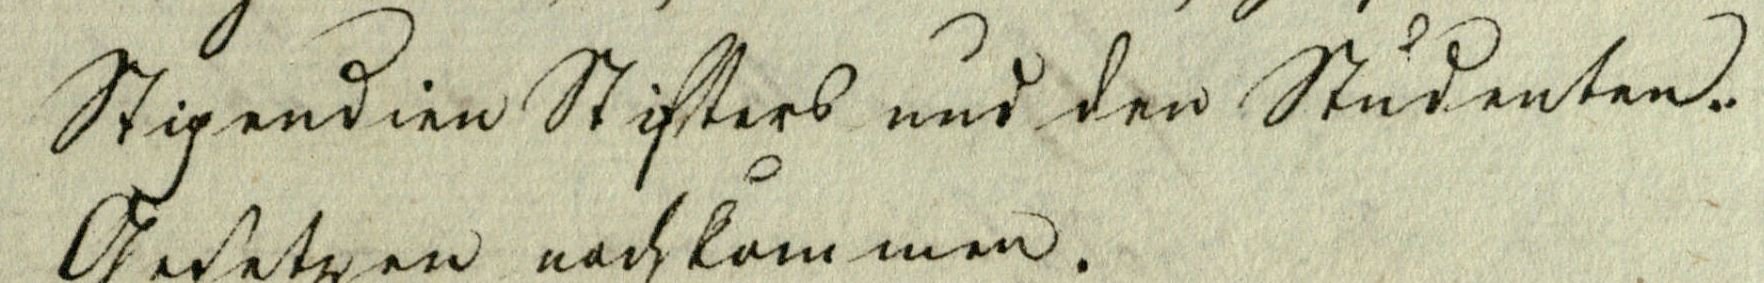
Stipendien Stifters und den Studenten¬
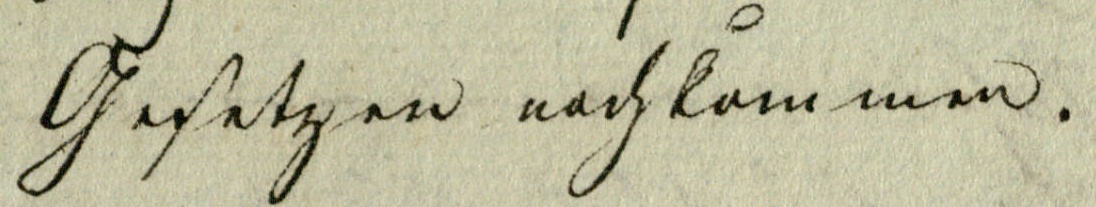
Gesetzen nachkommen.
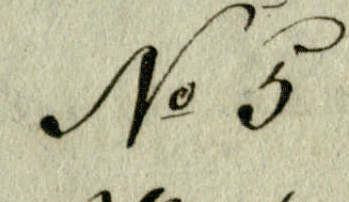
Nº 5
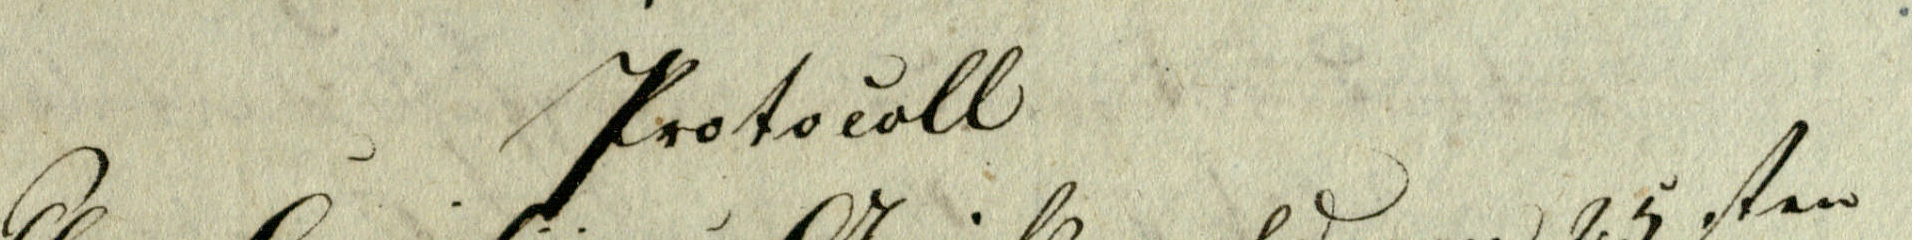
Protocoll
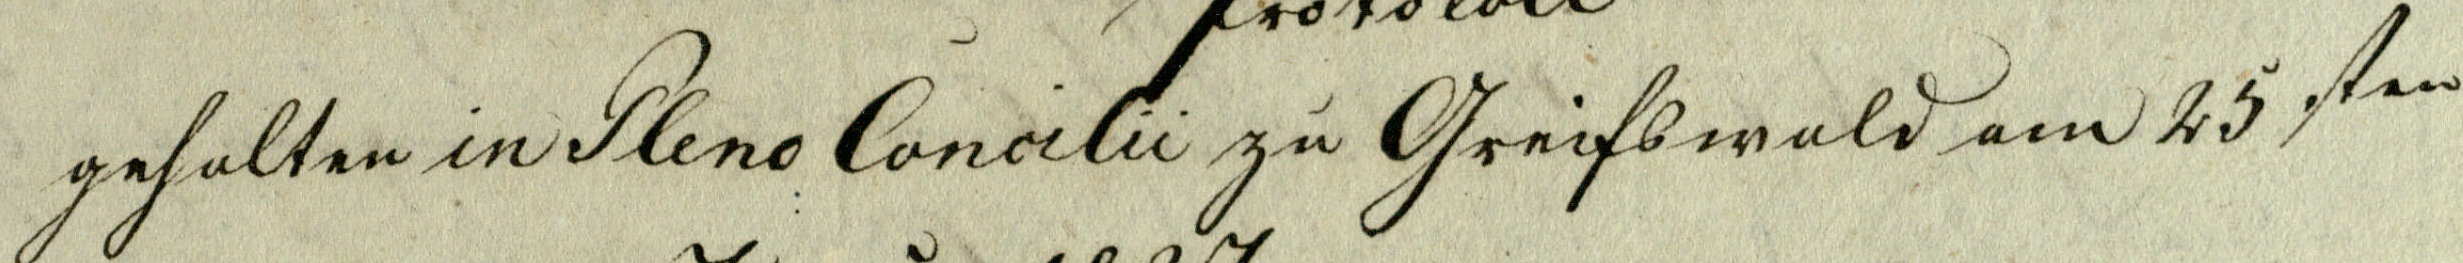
gehalten in Pleno Concilii zu Greifswald am 25ten
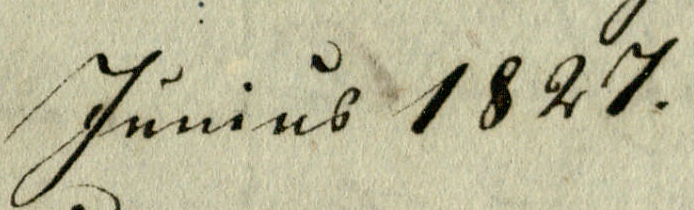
Junius 1827
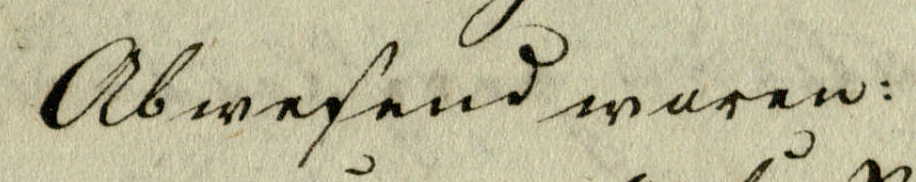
Abwesend waren:
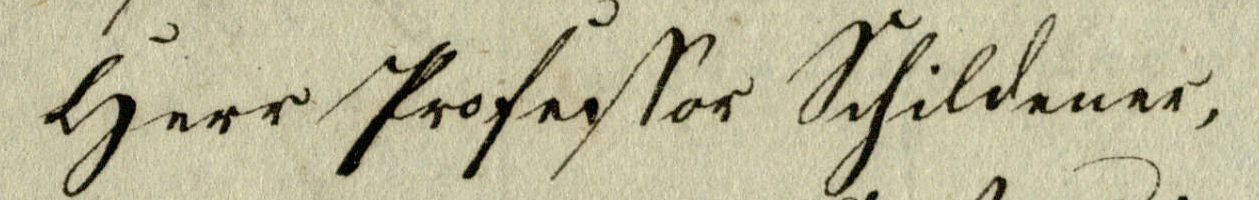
Herr Professor Schildener,
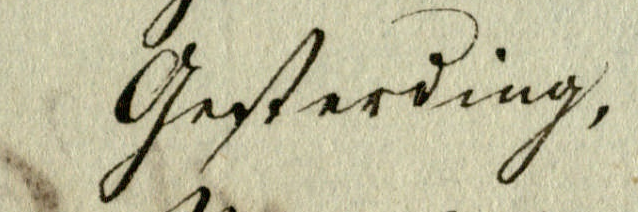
Gesterding,
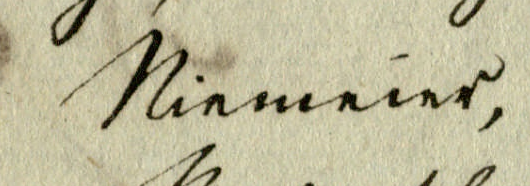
Niemeier,
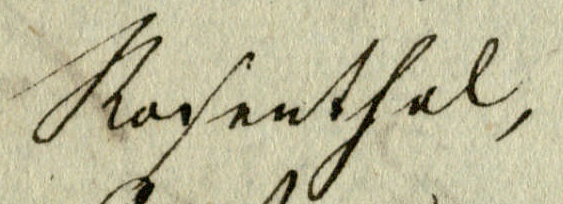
Rosenthal,
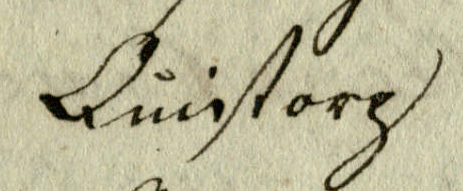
Quistorp,
